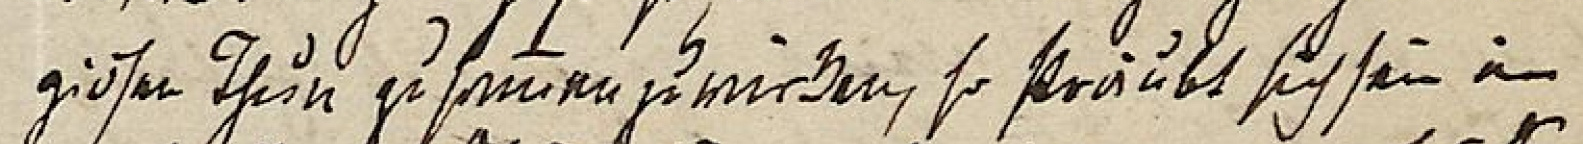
giösem Thun zusamenzuwirken, so sträubt sich sein im
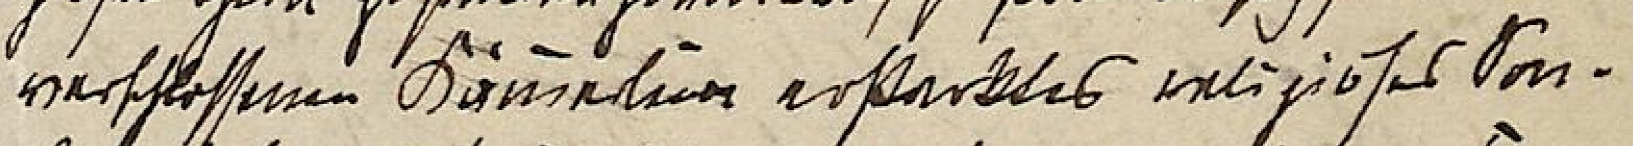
verschlossenen Kämerlein erstarktes religiöses Son¬
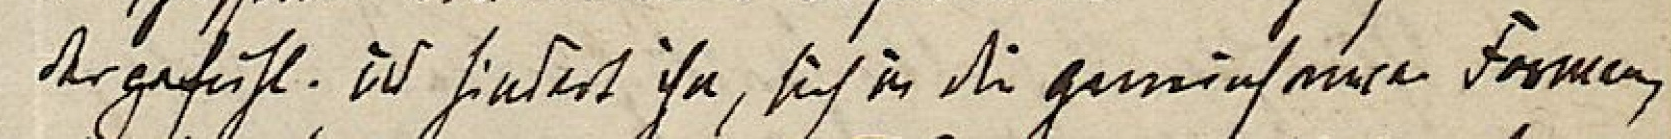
dergefühl und hindert ihn, sich in die gemeinsamen Formen,
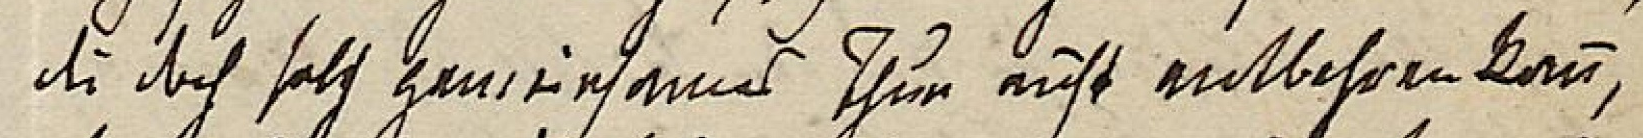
die doch solch gemeinsames Thun nicht entbehren kan,
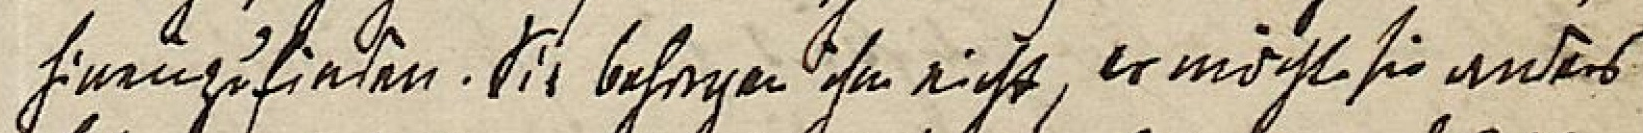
hineinzufinden. Sie bergen ihn nicht, er möchte sie anders
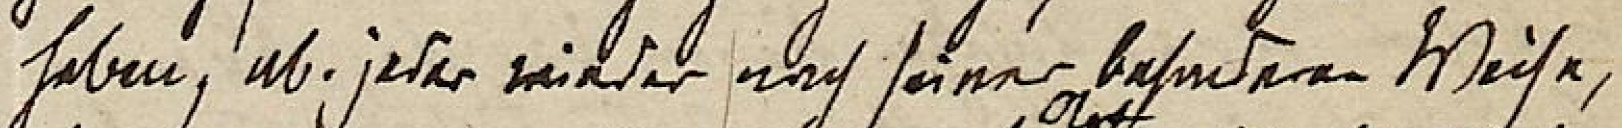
haben, jeder wieder nach seiner besonderen Weise,
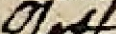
Art
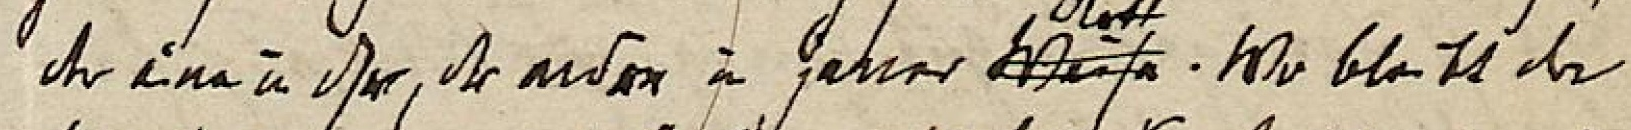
der eine in dsr, der andre in jener Weise. Wo bleibt da
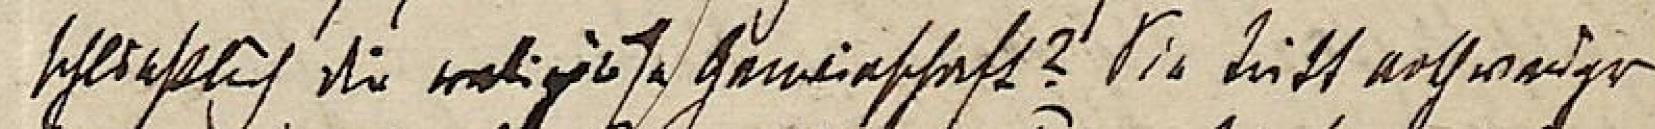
schließlich die religiöse Gemeinschaft? Sie tritt nothwendiger
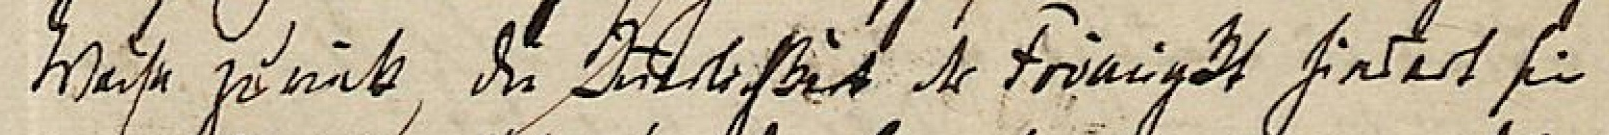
Weise zurück, die Inerlichkeit der Frömigkeit hindert sie
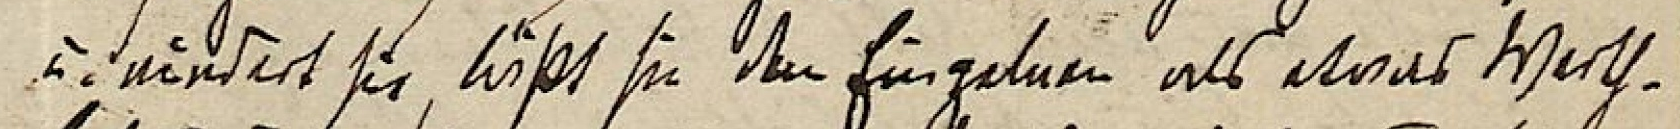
u. mindert sie, läßt sie den Einzelnen als etwas Werth¬
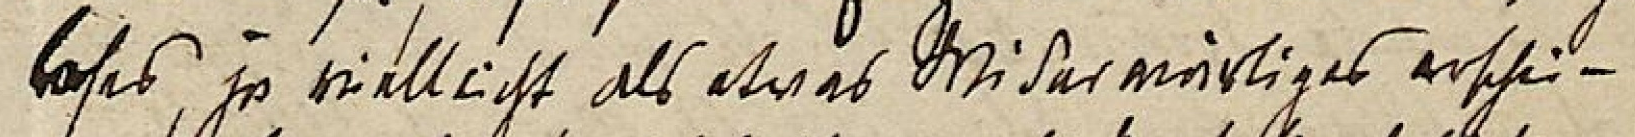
loses, ja vielleicht als etwas Widerwärtiges erschei¬
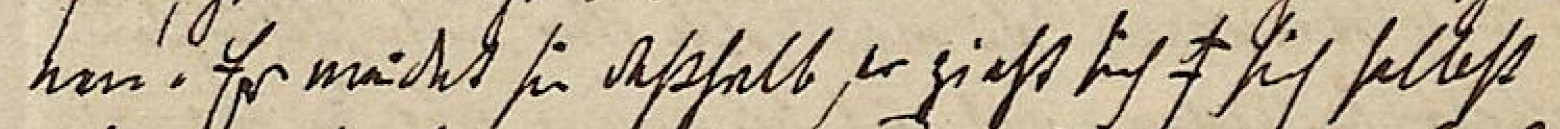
nen. Er meidet sie deßhalb, er zieht sich f sich selbst
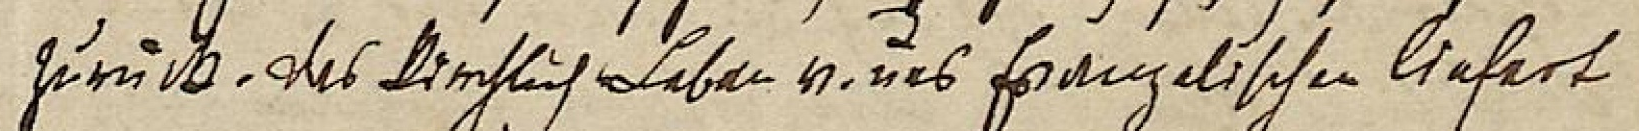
zurück. Das kirchliche Leben v. uns Evangelischen liefert
